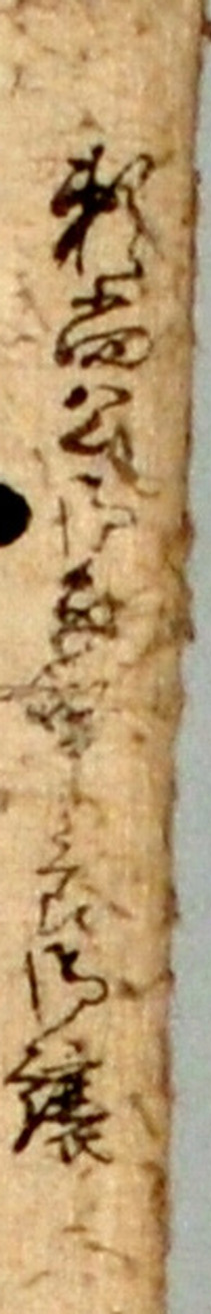頼直公御家督之節御譲
